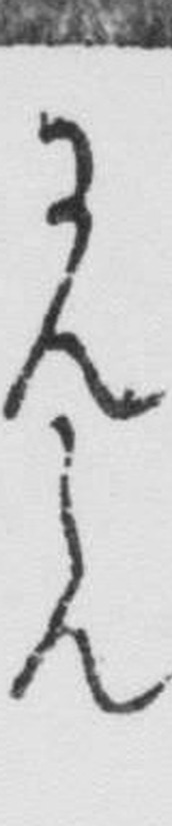にんしん
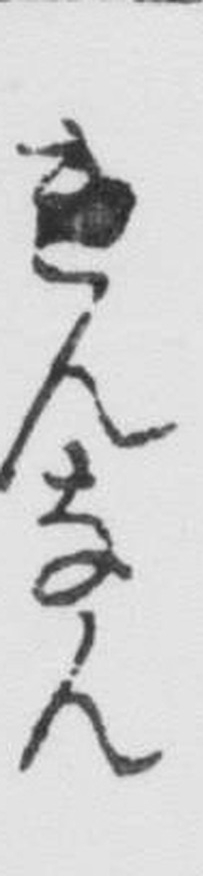きんなん
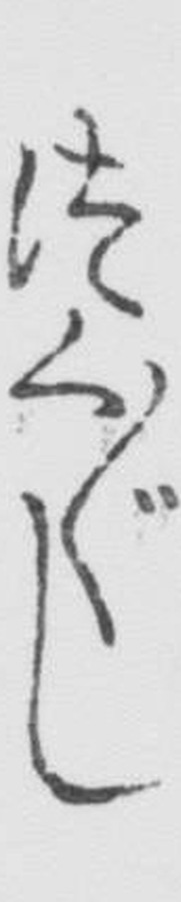つく〴〵し
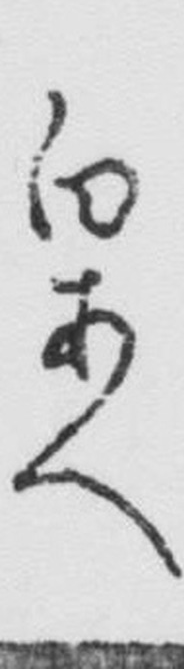青あへ
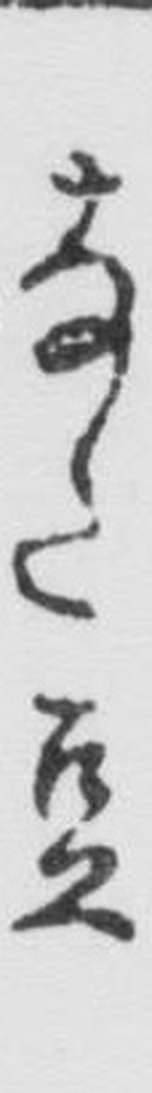なた豆
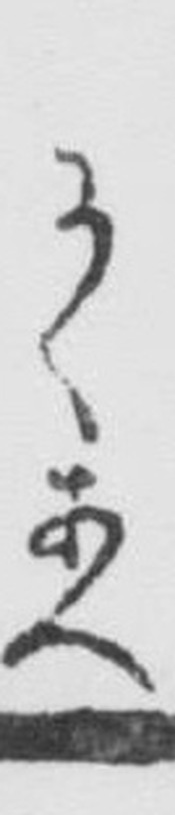にくあへ
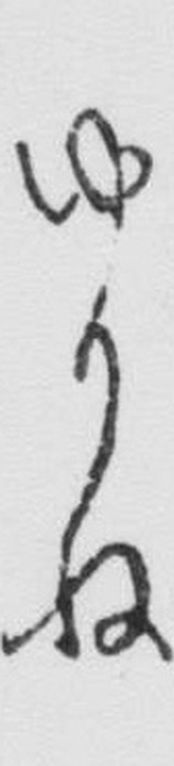ゆりね
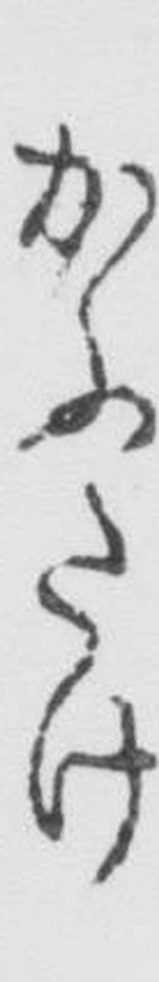かふたけ
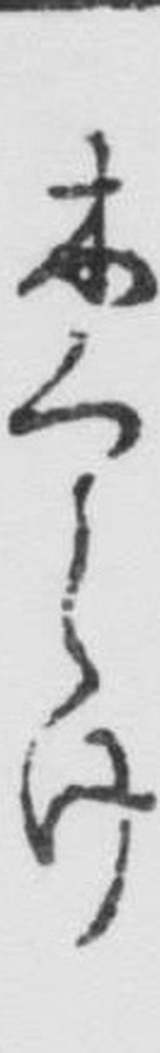木くらけ
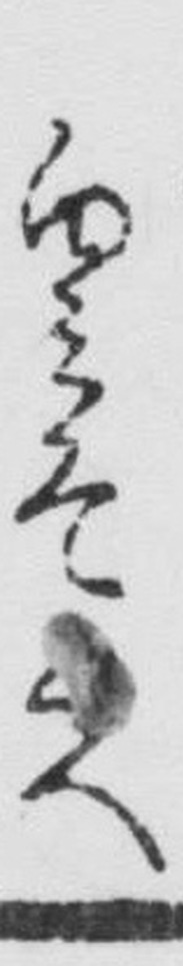白みそあへ
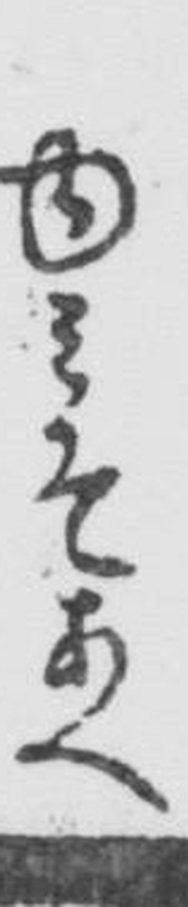ゆみそあへ
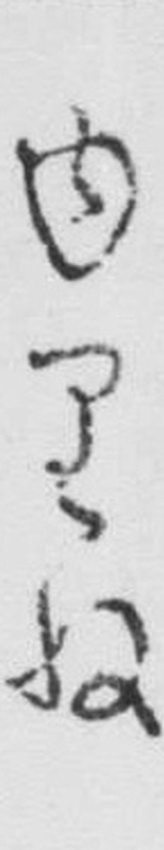ゆりね
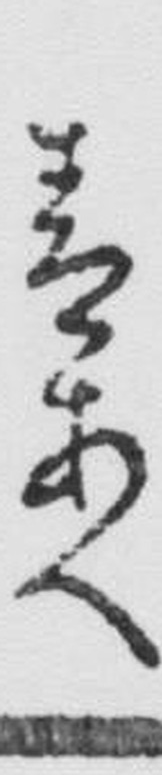青あへ
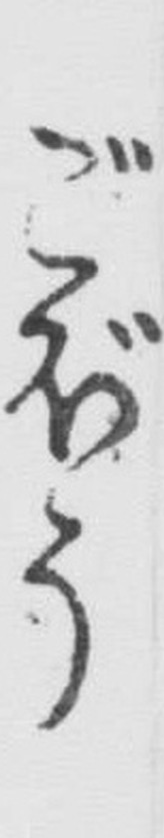ごぼう
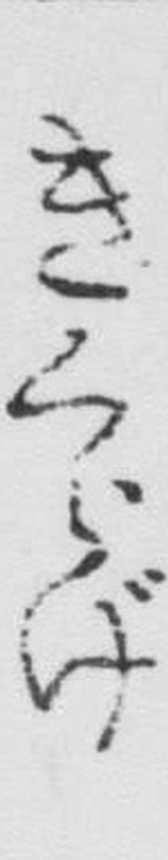木くらげ
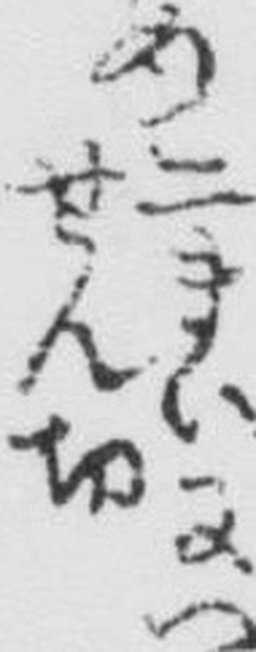せん切
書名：諸家通用/即席料理
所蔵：大阪府立大学学術情報センター 国文学研究資料館
